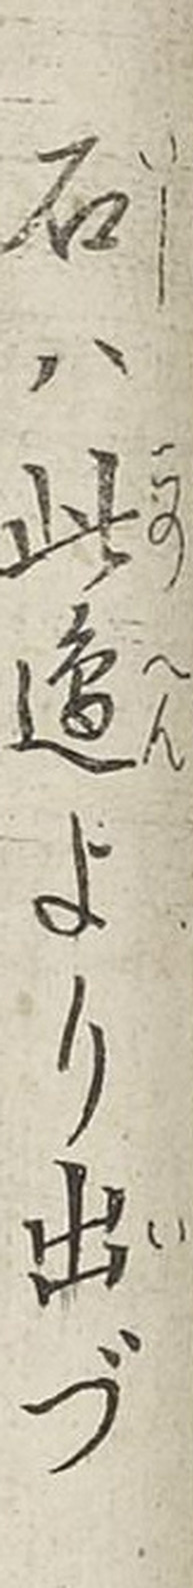石は此辺より出づ
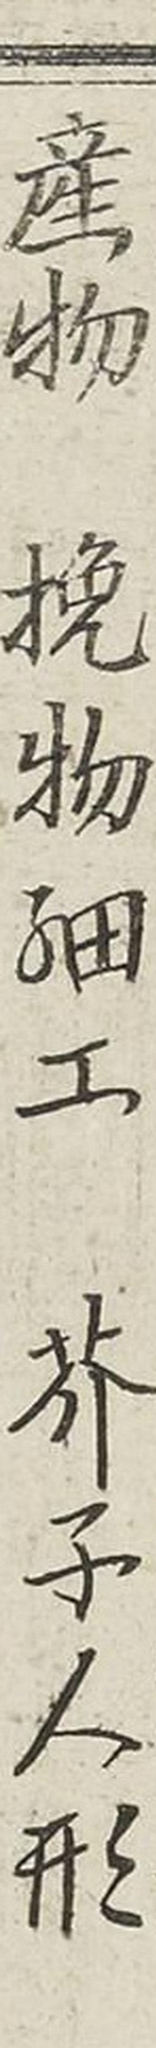産物挽物細工芥子人形
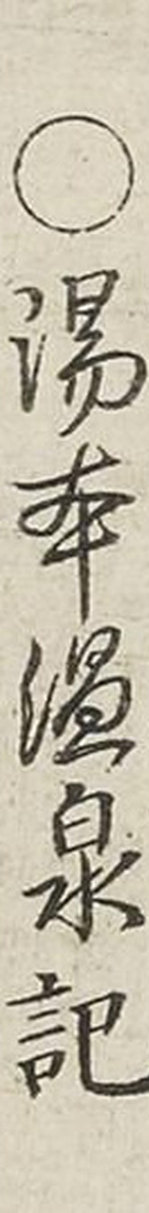〇湯本温泉記
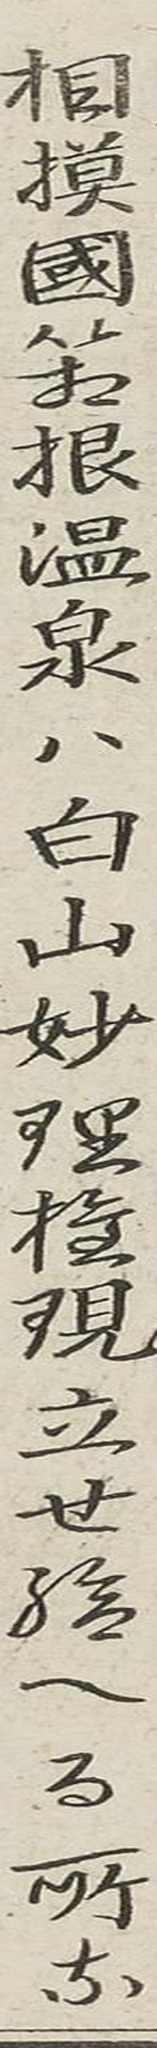相模国箱根温泉は白山妙理権現立せ給へる所な
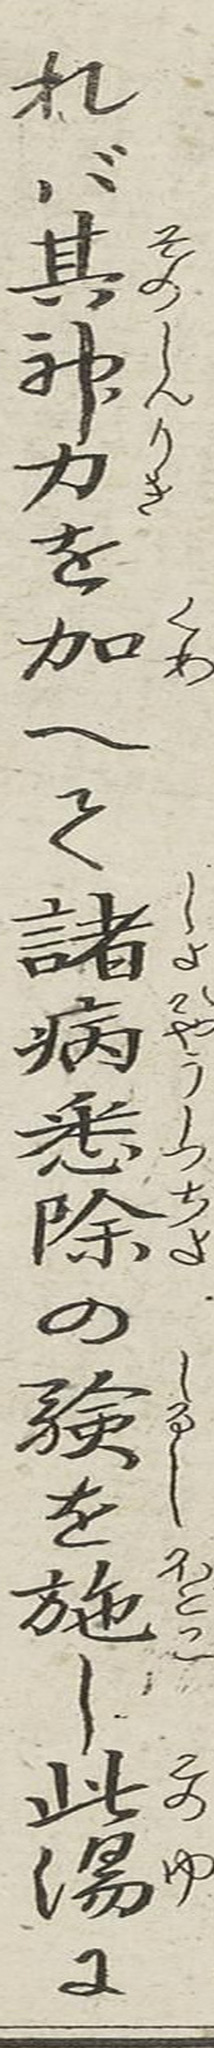れば其神力を加へて諸病悉除の験を施し此湯に
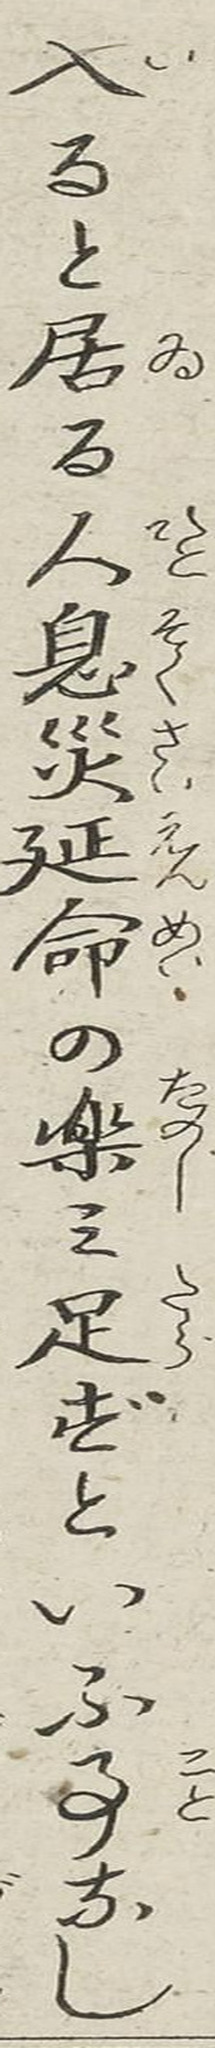入ると居る人息災延命の楽み足ずといふ事なし
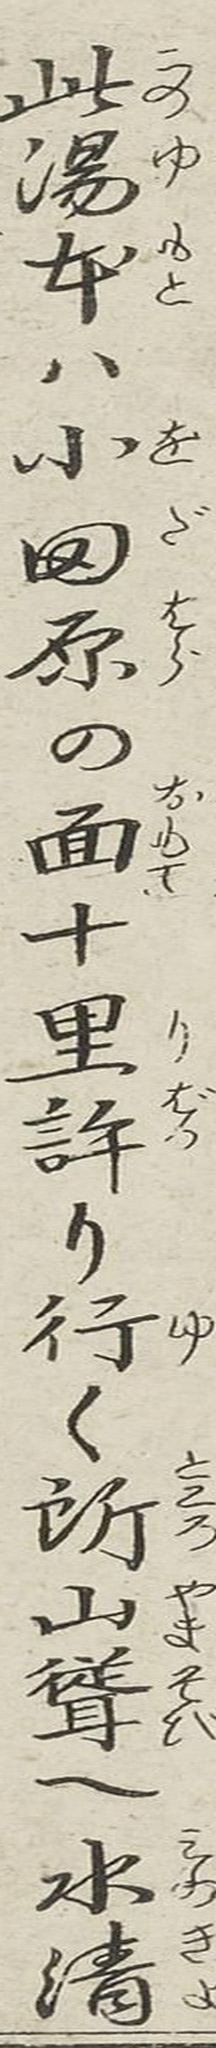此湯本は小田原の面十里許り行く所山聳へ水清
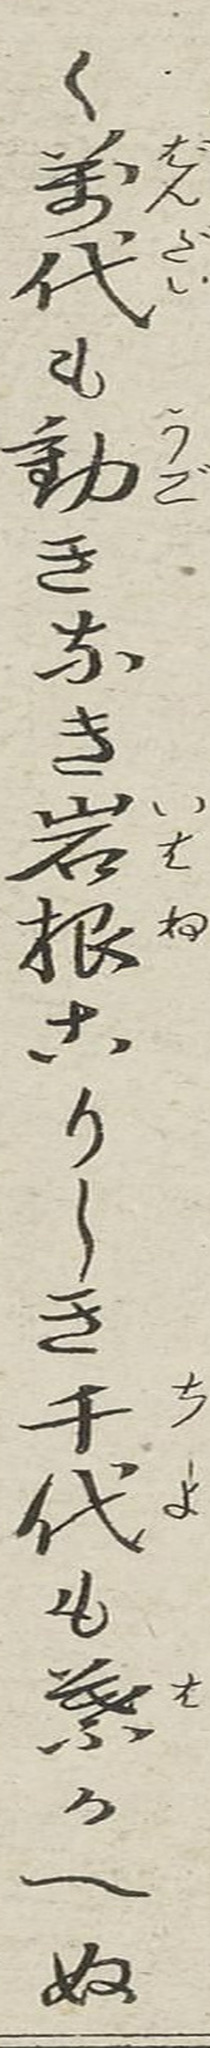く萬代も動きなき岩根こりしき千代も葉かへぬ
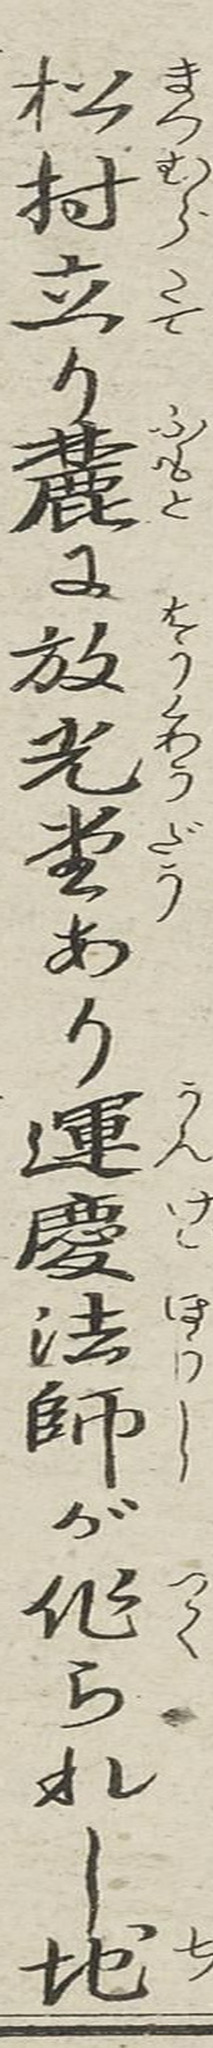松村立り麓に放光堂あり運慶法師が作られし地
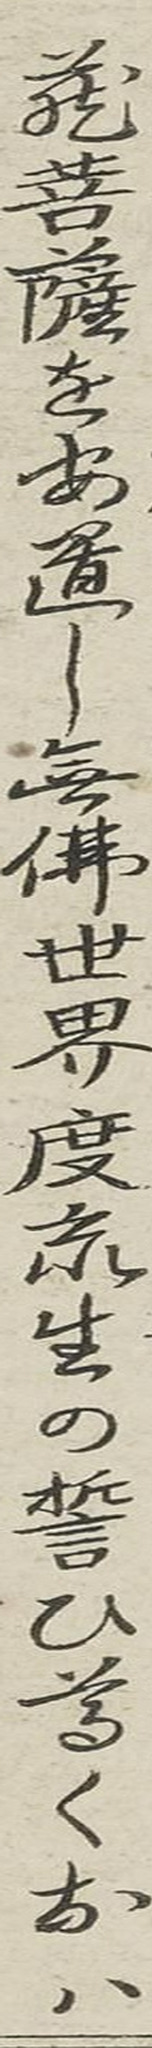蔵菩薩を安置し無佛世界度衆生の誓ひ尊くおは

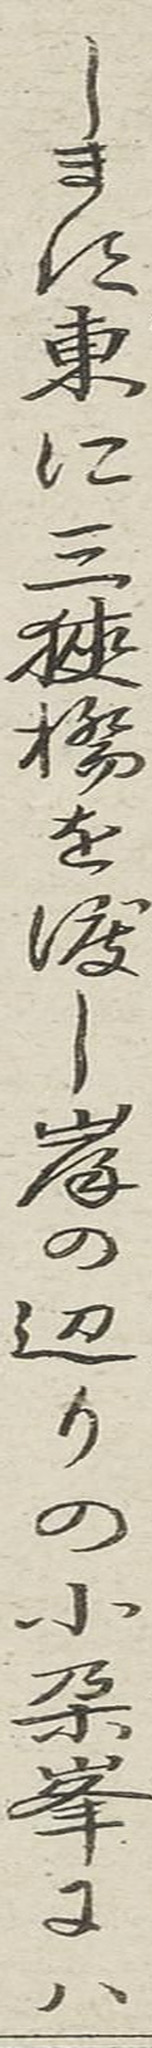します東に三挟橋を渡し岸の辺りの小朶峯には
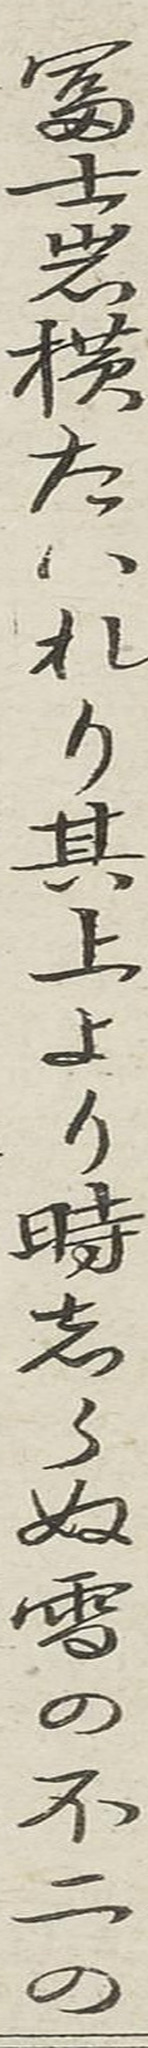冨士岩横たはれり其上より時しらぬ雪の不二の
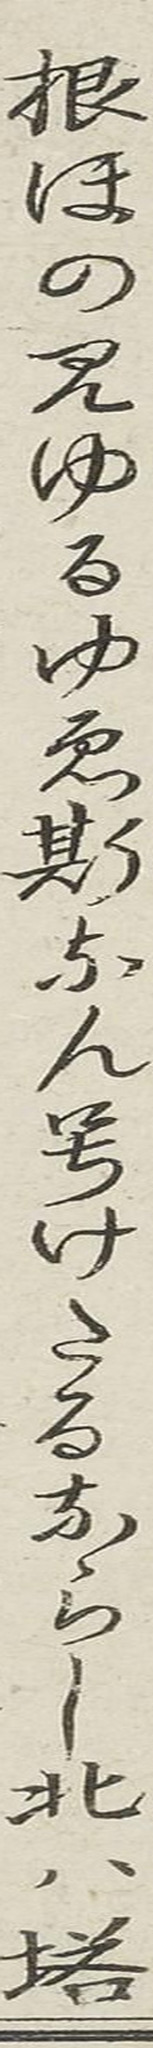根ほの見ゆるゆゑ斯なん号けたるならし北は塔
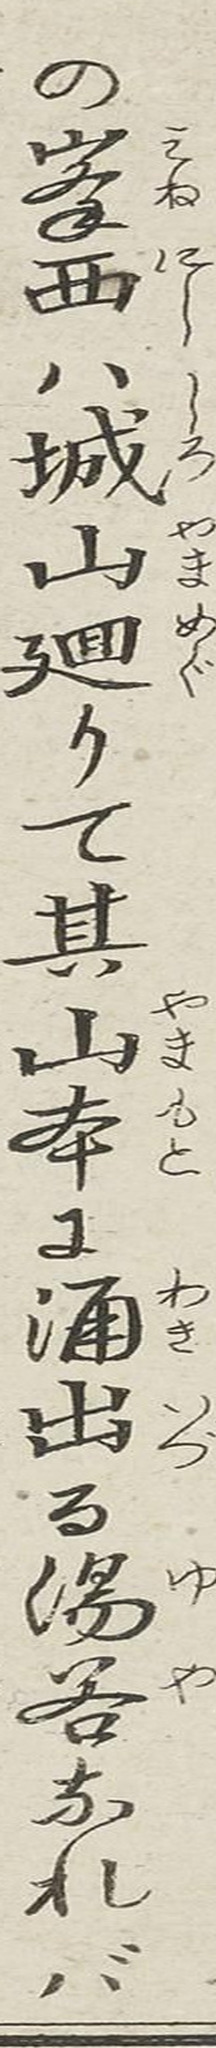の峯西は城山廻りて其山本に湧出る湯舎なれば
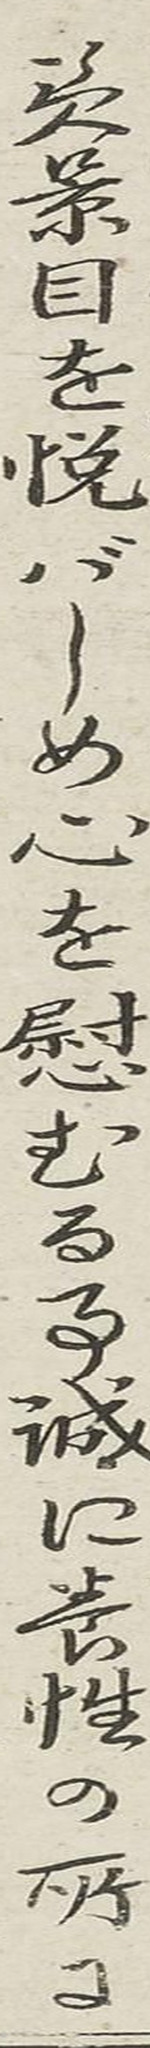美景目を悦ばしめ心を慰むる事誠に養性の所に
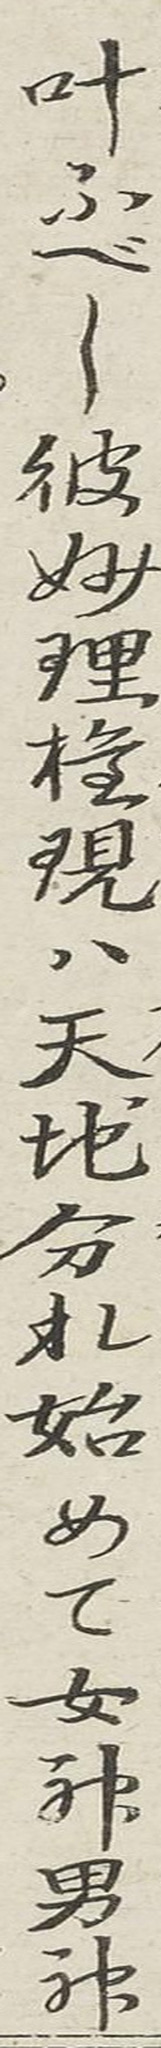叶ふべし彼妙理権現は天地分れ始めて女神男神
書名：箱根温泉誌　全
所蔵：東京大学地震研究所図書室 Earthquake Research Institute Library, The University of Tokyo, JAPAN
